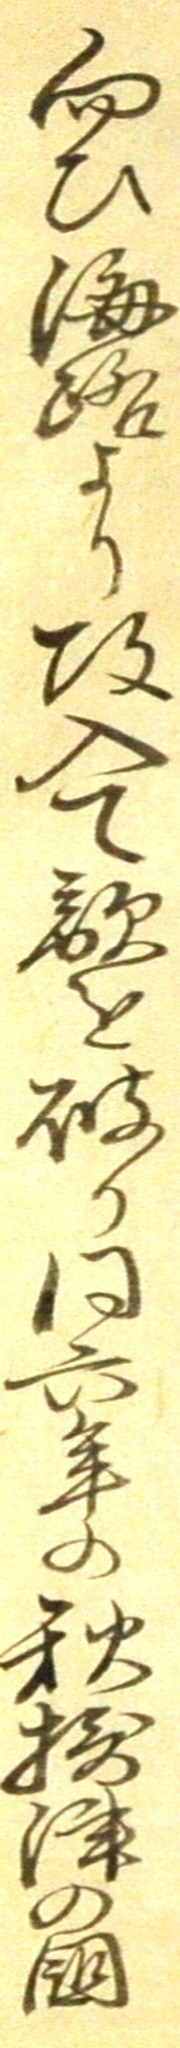向ひ海路より攻入て敵を破り同六年の秋摂津の国
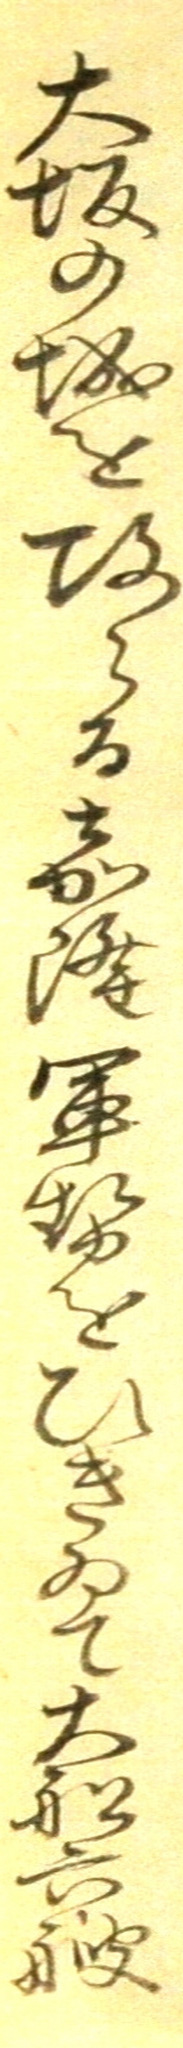大坂の城を攻らる嘉隆軍勢をひきゐて大船六艘

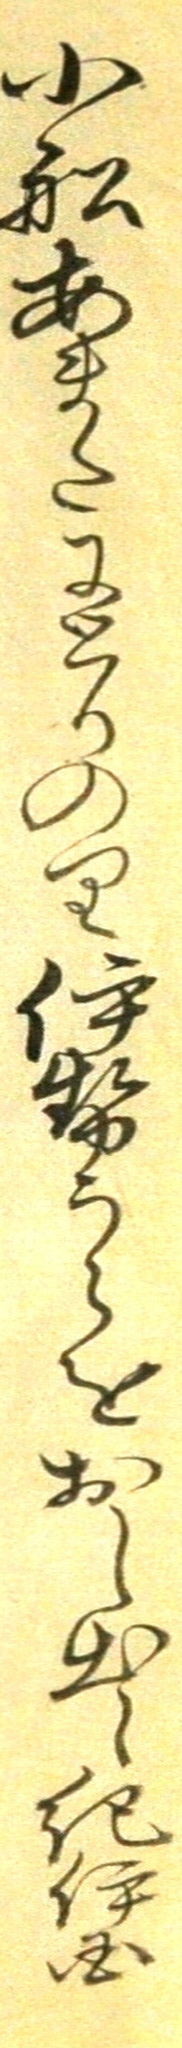小船あまたにとりのり伊勢うらをおし出し紀伊国
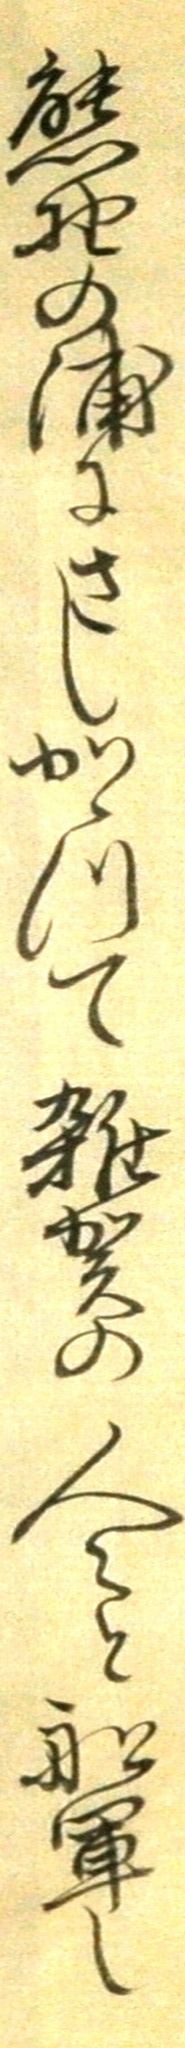熊野の浦にさしかゝつて雑賀の人々と船軍し
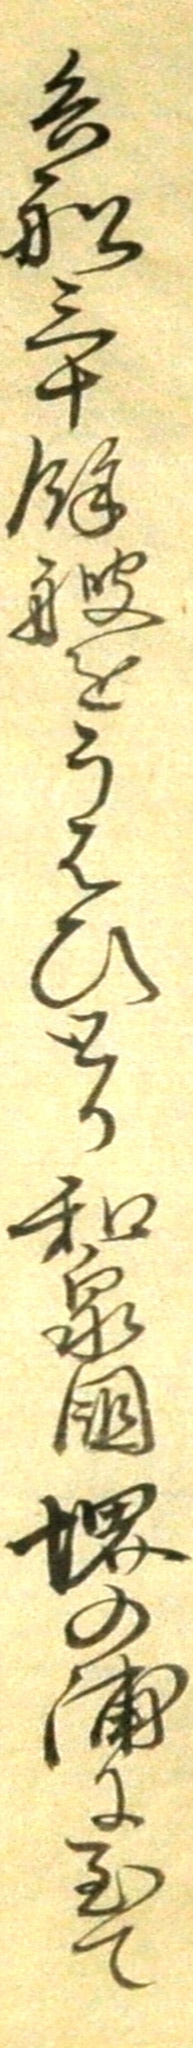兵船三十余艘をうはひとり和泉国堺の浦に至て
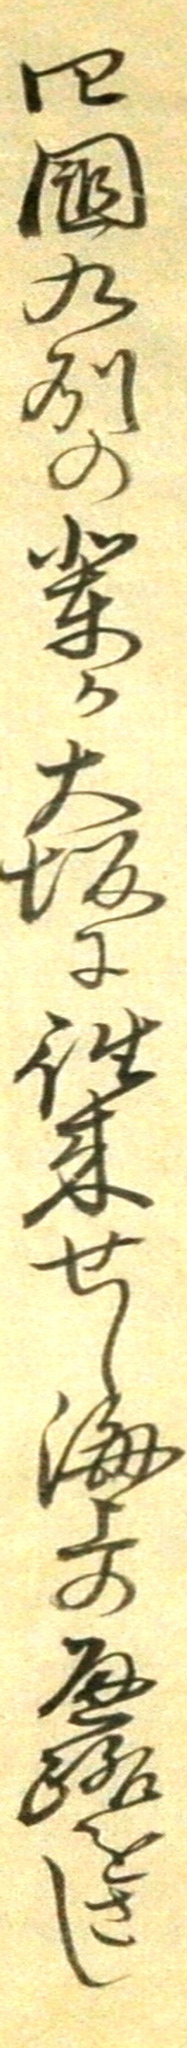四国九州の輩か大坂に往来せし海上の通路をさし
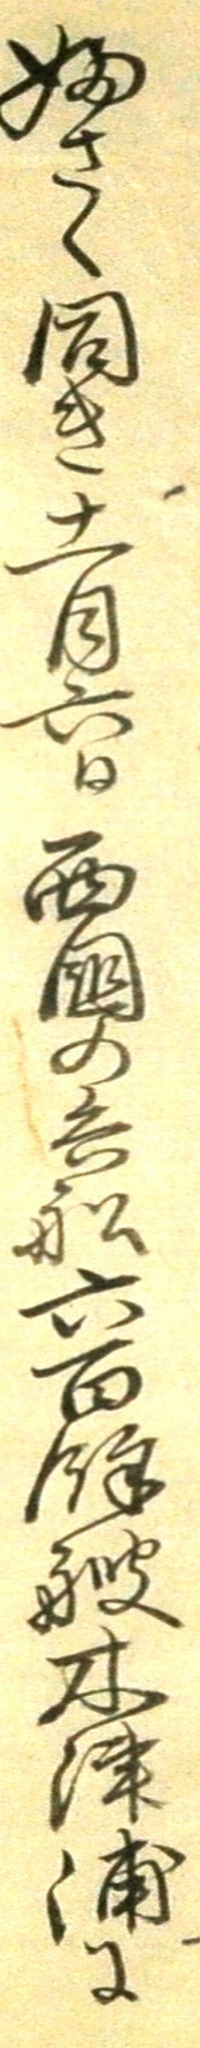ふさく同き十一月六日西国の兵船六百余艘木津浦に
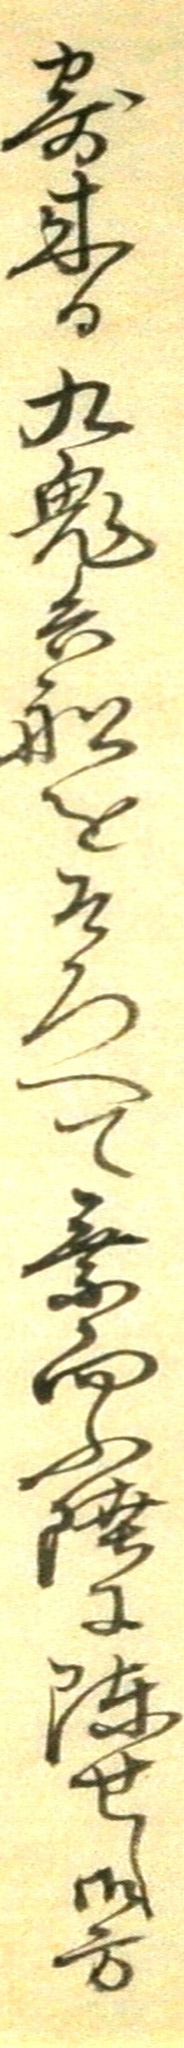寄来る九鬼兵船をそろへて乗向ふ陸に陣せし御方
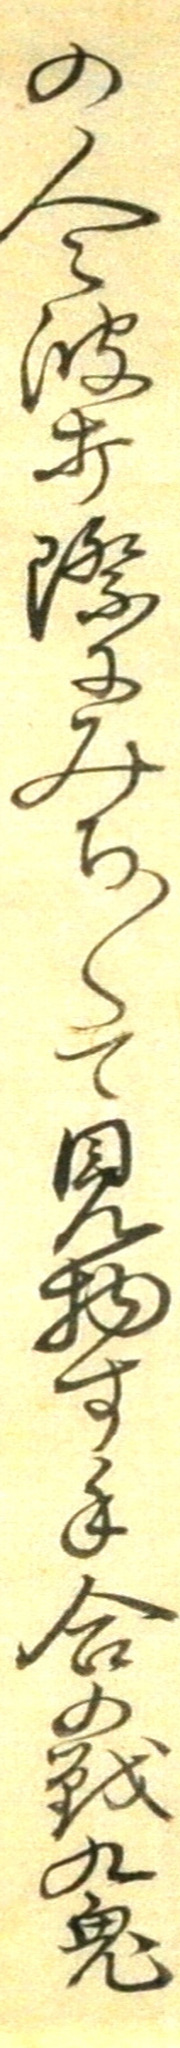の人々波打際にみち〳〵て見物する手合の戦九鬼
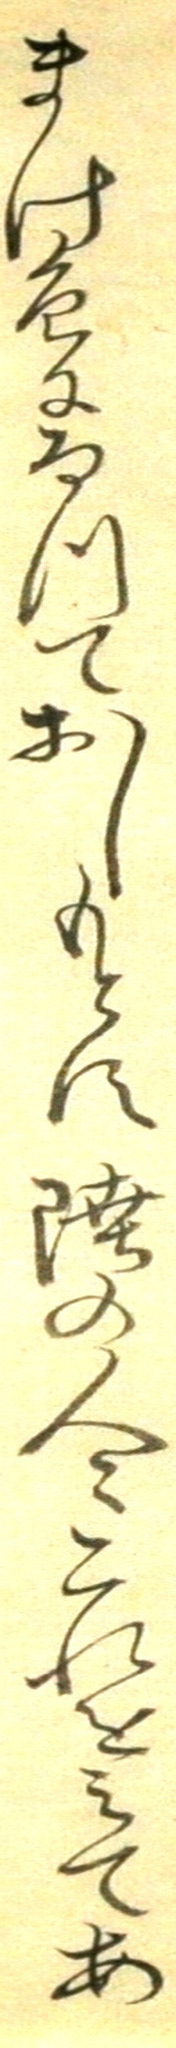まけ色になつておしもとす陸の人々これをみてあ
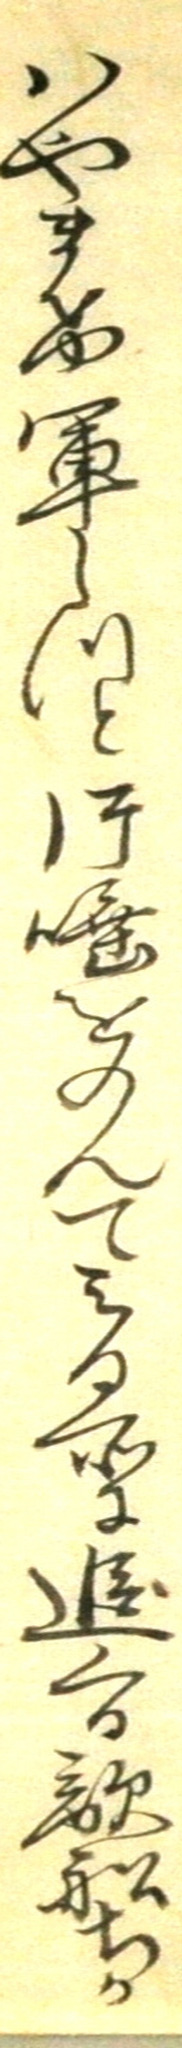はやまけ軍しつと片唾をのんてみる所に追くる敵船ちか
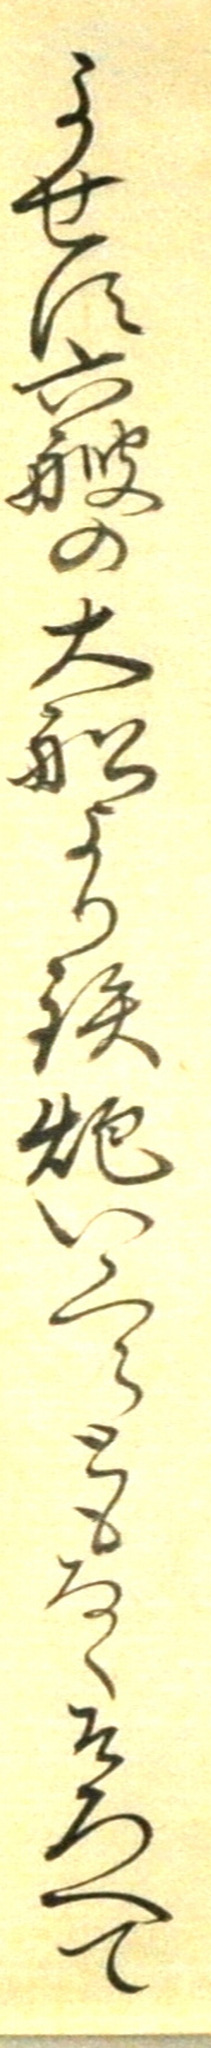よせす六艘の大船より鉄炮いくらともなくそろへて
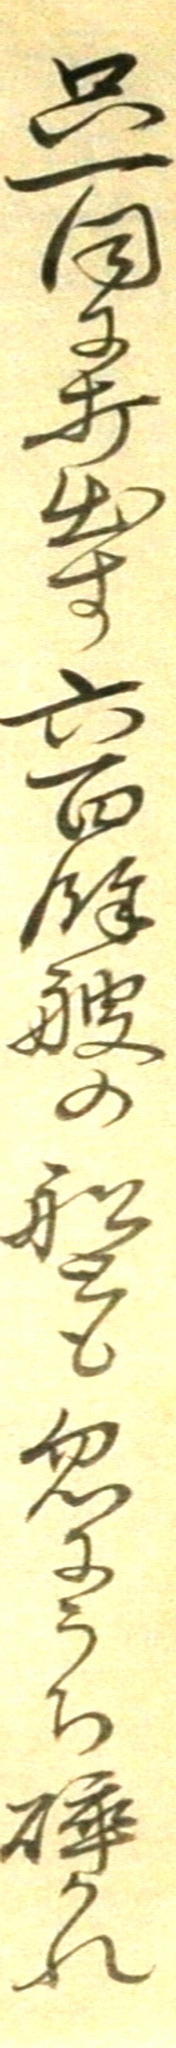只一同に打出す六百余艘の船とも忽にうち砕かれ
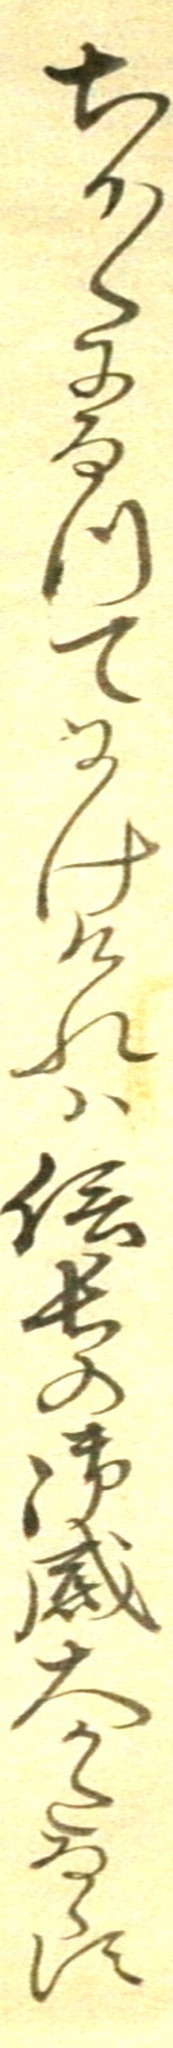ちかくになつてにけけれは信長の御威大かたならす
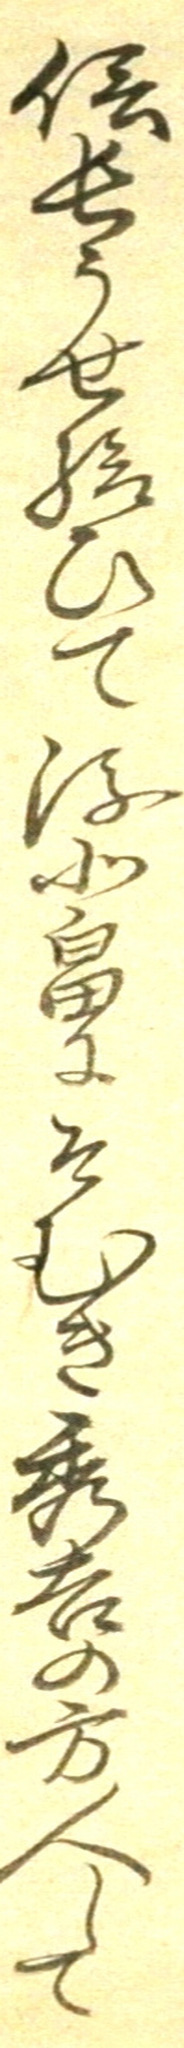信長うせ給ひて後北畠にそむき秀吉の方人して
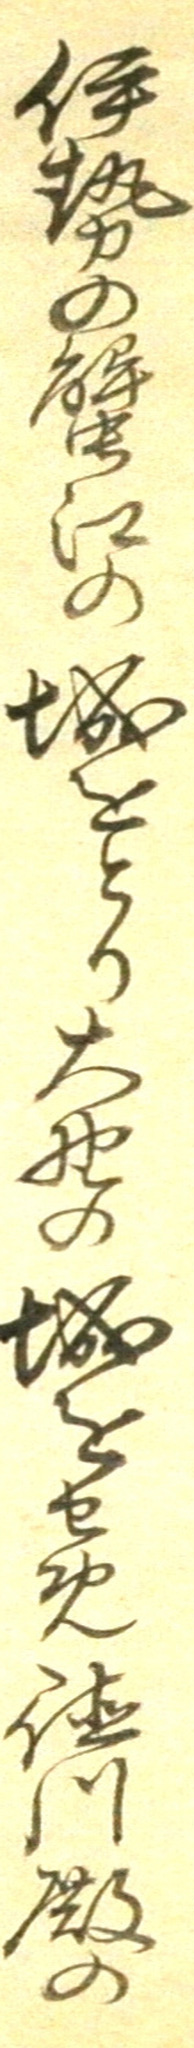伊勢の蟹江の城をとり大野の城をせめ徳川殿の
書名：藩翰譜（九・上）
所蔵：伊那市立高遠町図書館・合同会社AMANE
